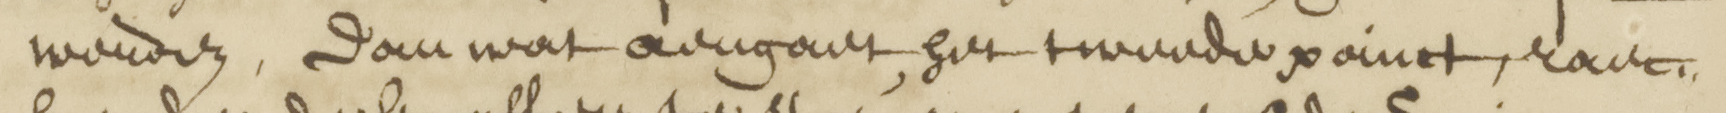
werden. Dan wat aengaet het tweede poinct, raec„
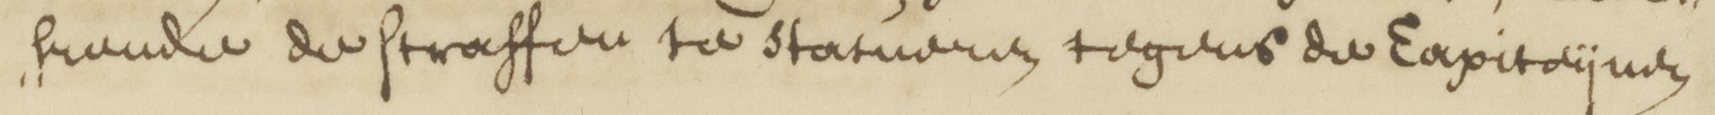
,,kende de straffen te statueren tegens de Capiteijnen,
